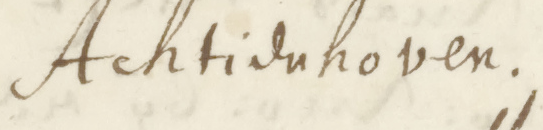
Achtienhoven.
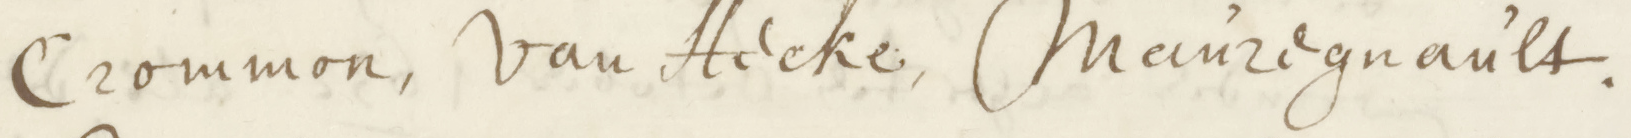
Crommon, Van Hecke, Mauregnault.
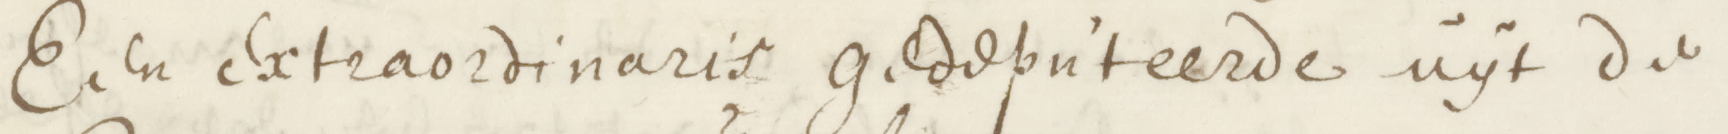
Een Extraordinaris gedeputeerde uijt de
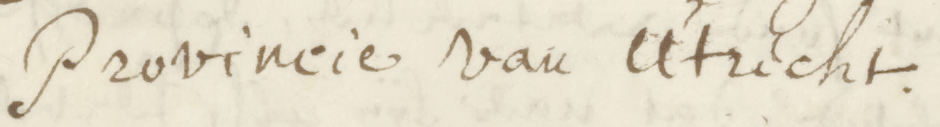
Provincie van Utrecht.
